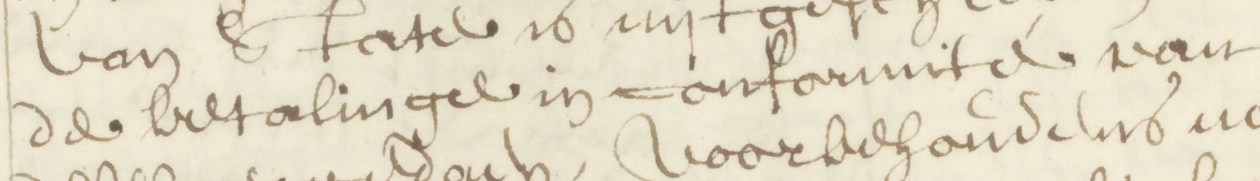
de betalinge in conformité van
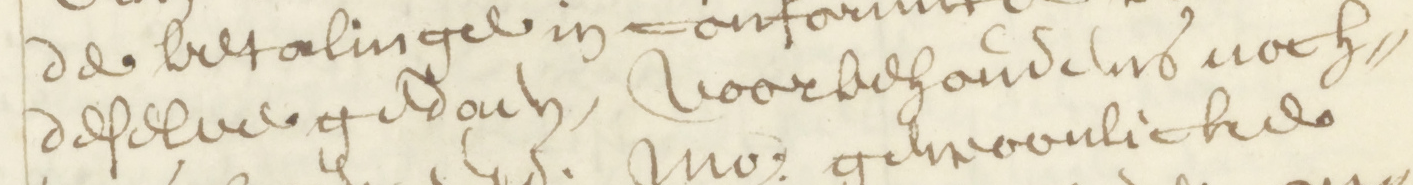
deselve gedaen, voorbehoudens noch„
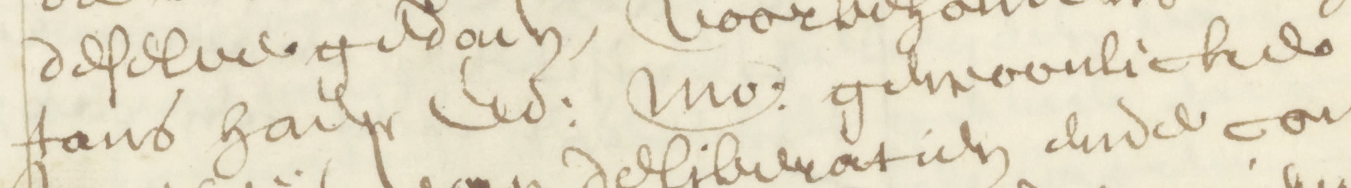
tans haer Ed: Mo: gewoonlicke
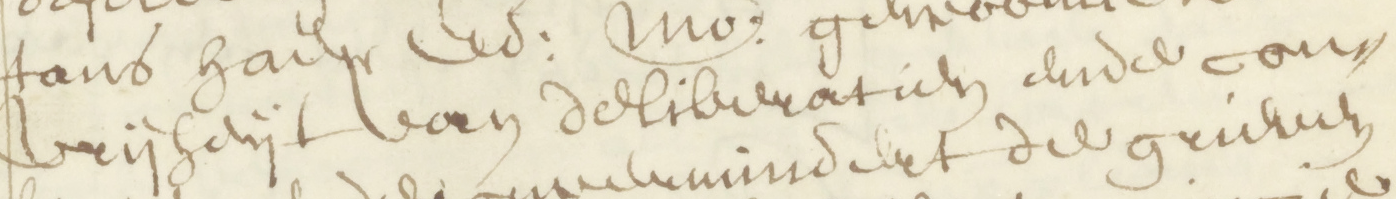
vrijheijt van deliberatien ende con„
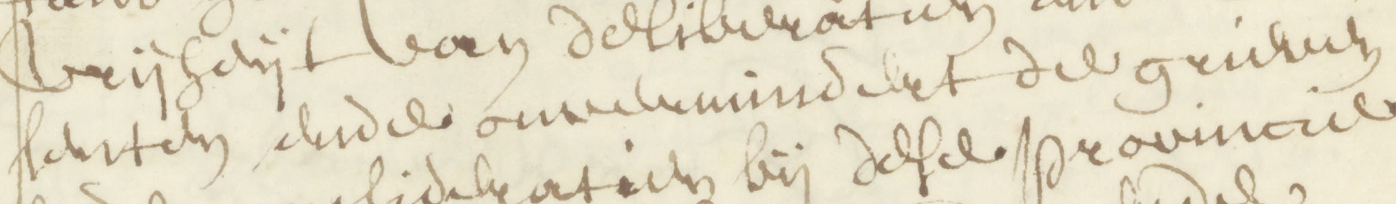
centen ende onvermindert de grieven
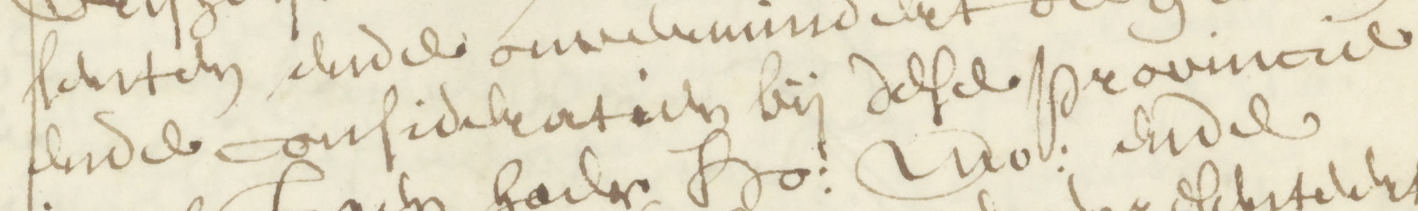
ende consideratien bij dese provincie
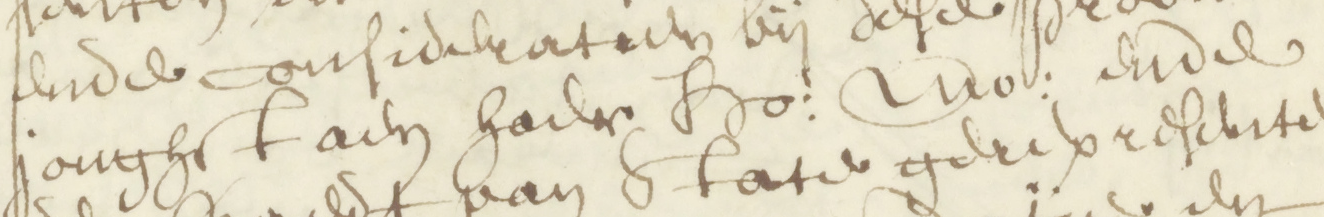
jonghst aen haer Ho:Mo: ende
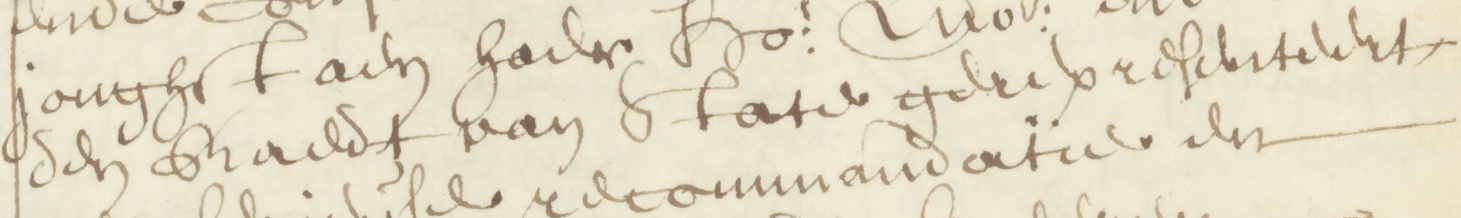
den Raedt van State gerepresenteert
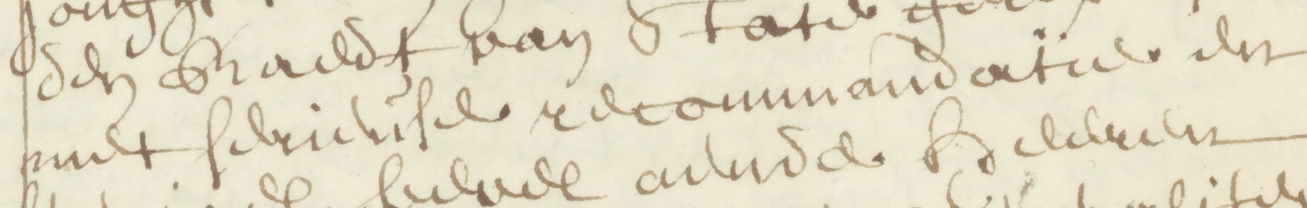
met serieuse recommandatie en
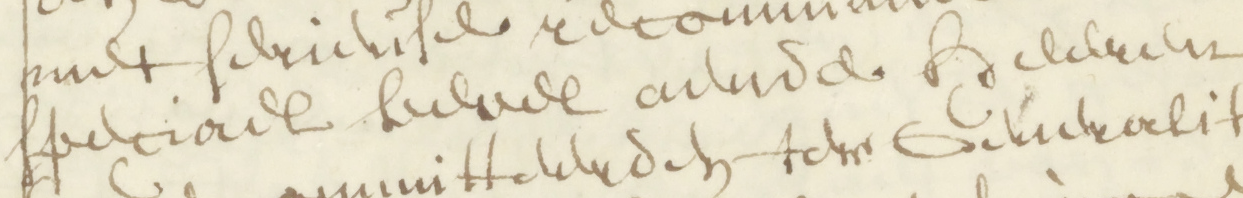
speciael bevel aende Heeren
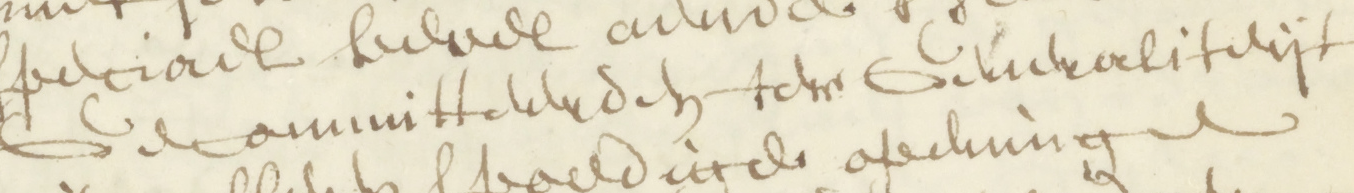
Gecommitteerden ter Generaliteijt
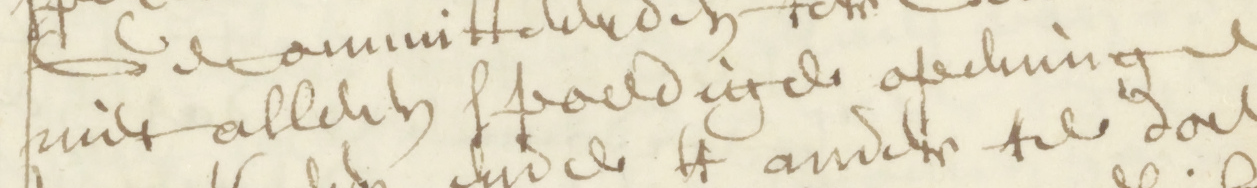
niet alleen spoedige openinge
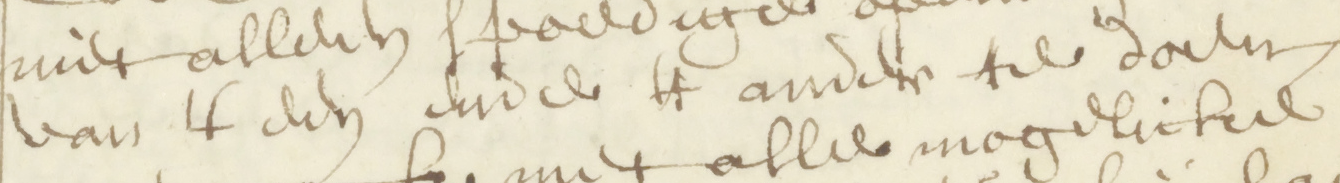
van ‛t een ende ‛t ander te doen,
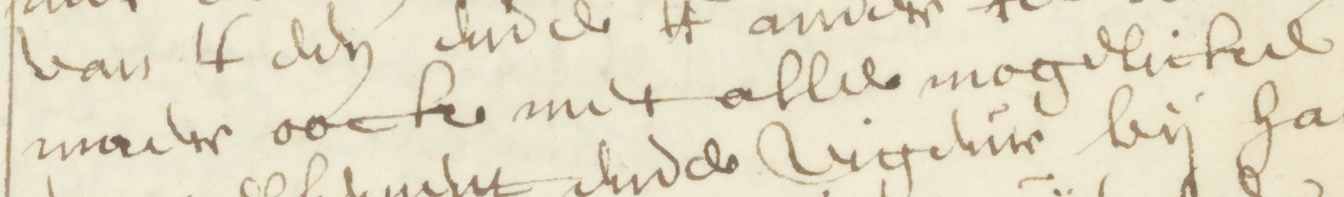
maer oock met alle mogelicke
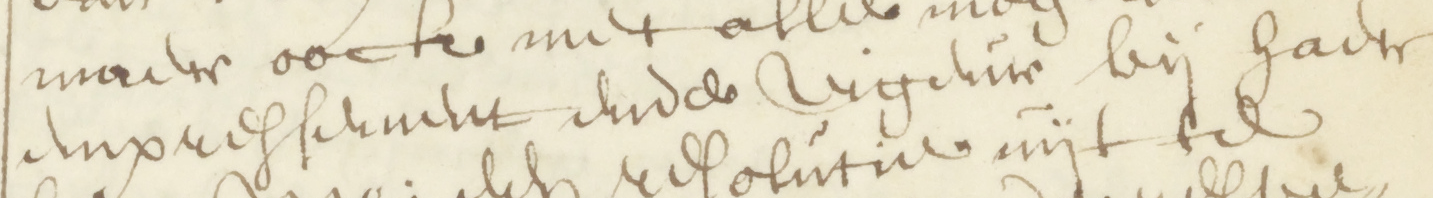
empressement en vigeur bij haer
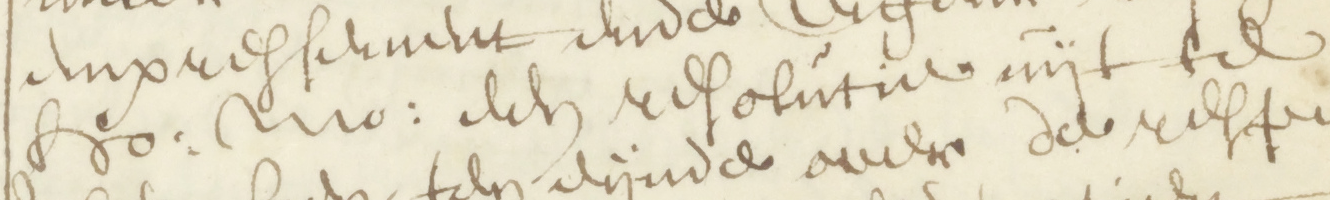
Ho:Mo: een resolutie uijt te
